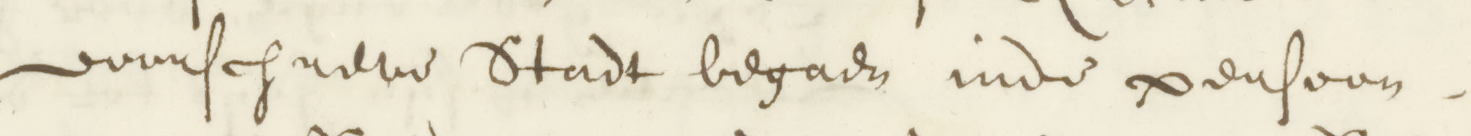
voorschreve Stadt begaen inde persoon
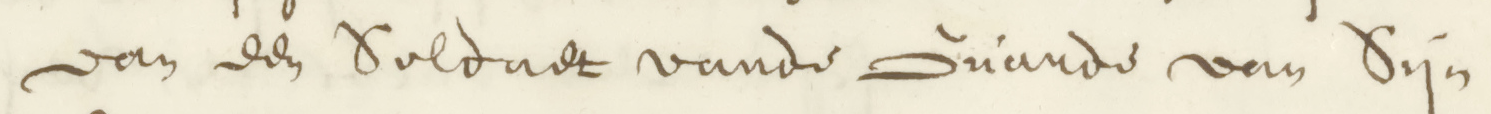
van een soldaet vande Guarde van Sijn
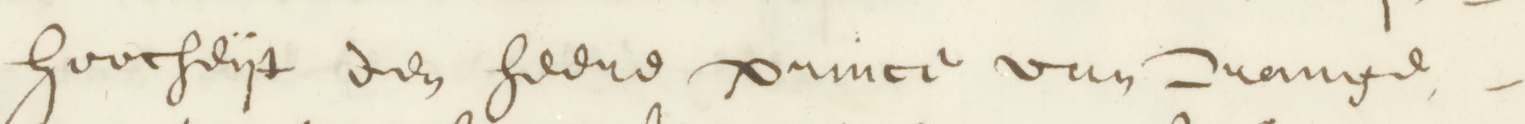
hoocheijt den heere prince van Orange,
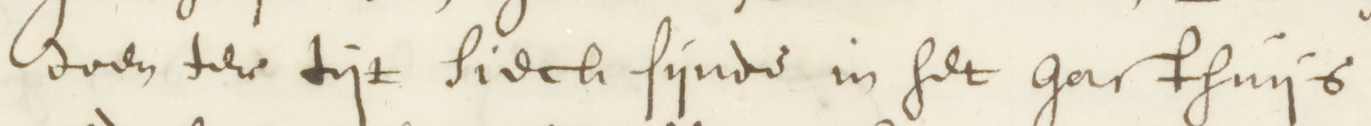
doen ter tijt sieck sijnde in het gasthuijs
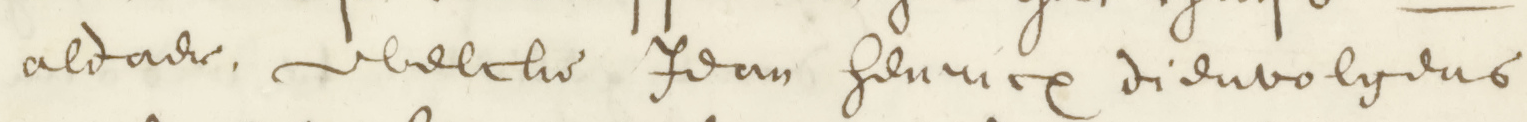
aldaer, welcke Jean henricx dienvolgens
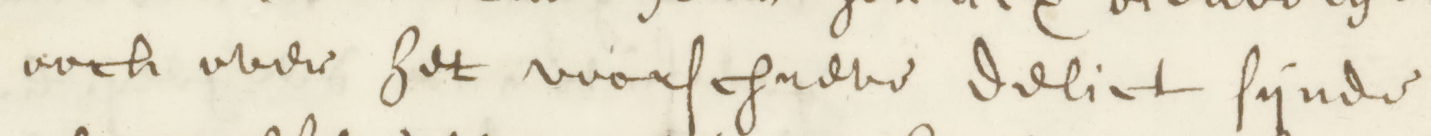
oock over het voorschreve delict sijnde
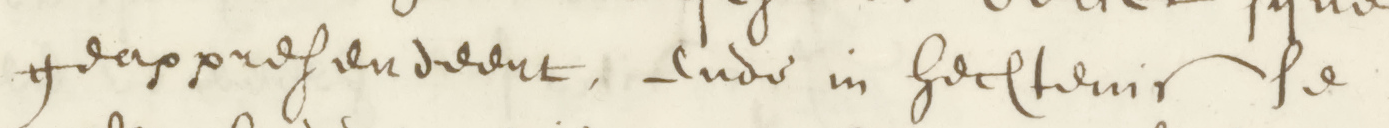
geapprehendeert, ende in hechtenisse
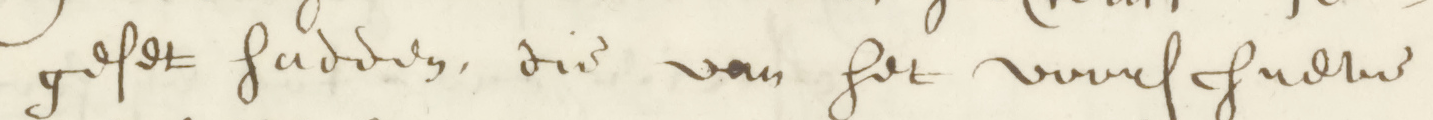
geset hadden, die van het voorschreve
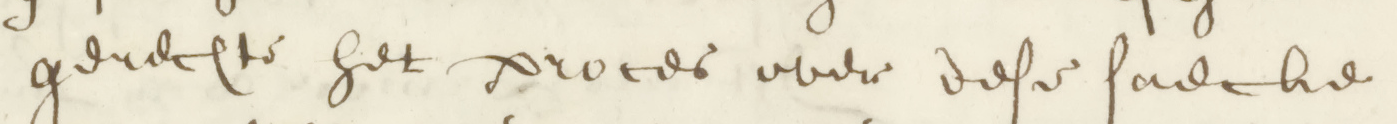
gerechte het proces over dese saecke
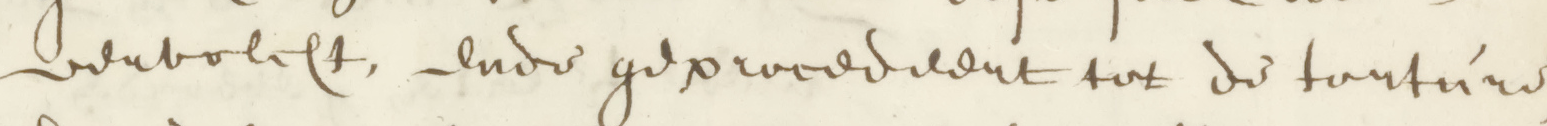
vervolcht, ende geprocedeert tot de torture,
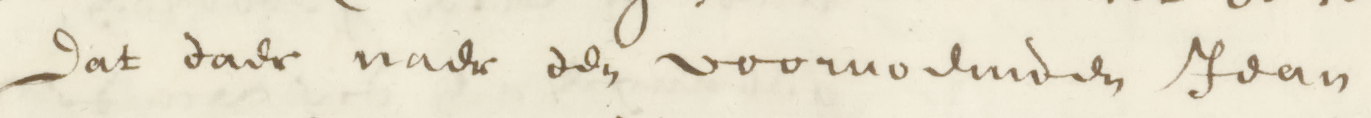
dat daer naer den voornoemden Jean
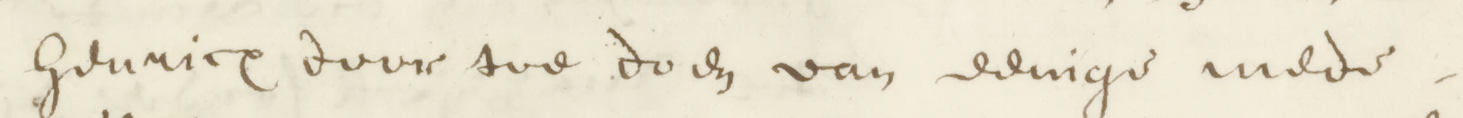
henricx door toe doen van eenige mede
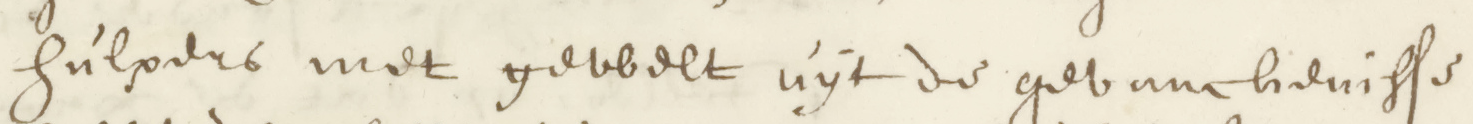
hulpers met gewelt uijt de gevanckenisse
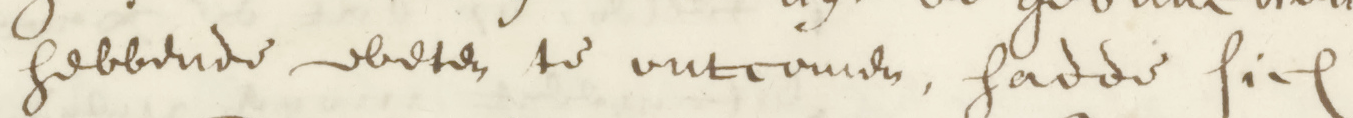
hebbende weten te ontcomen, hadde sich
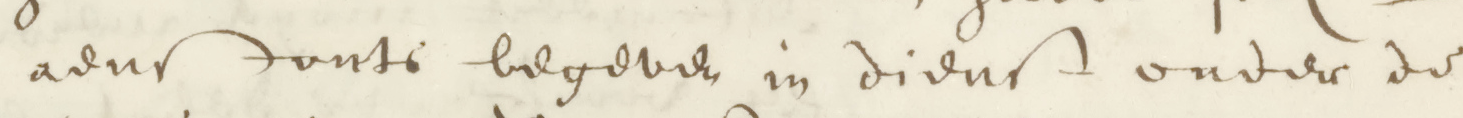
aenstonts begeven in dienst onder de
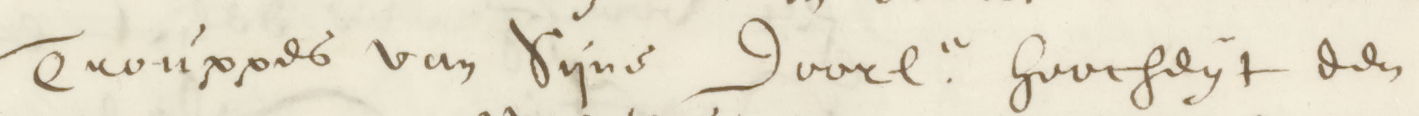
Trouppes van Sijne Doorle. hoocheijt den
